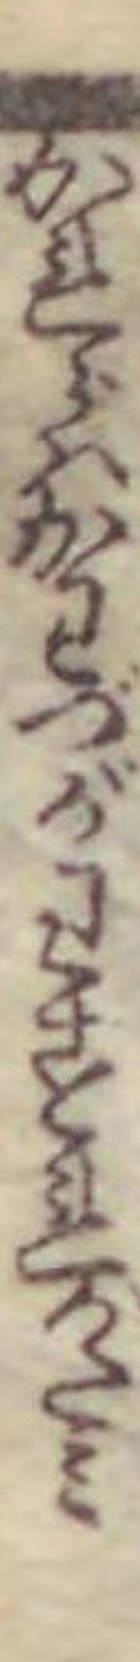かれらはかわづがわすれがたみ
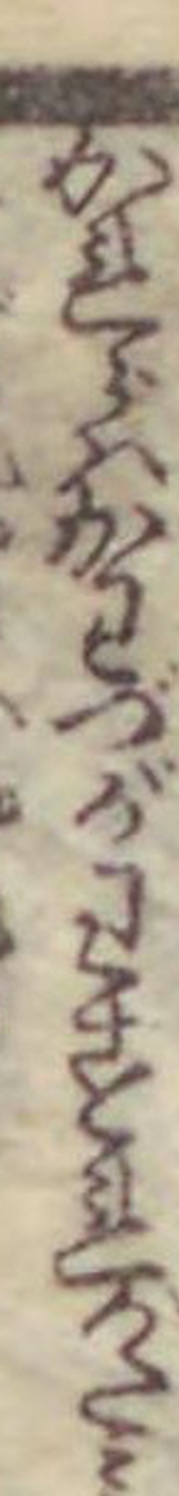かれらはかわづがわすれがたみ
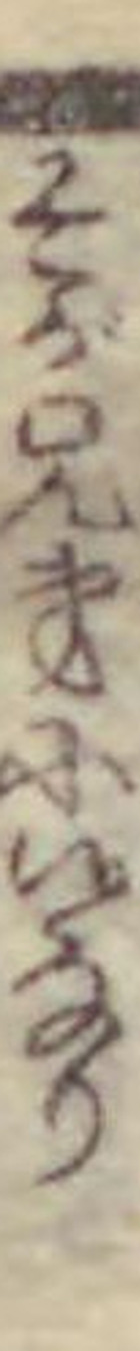そが兄弟に候なり
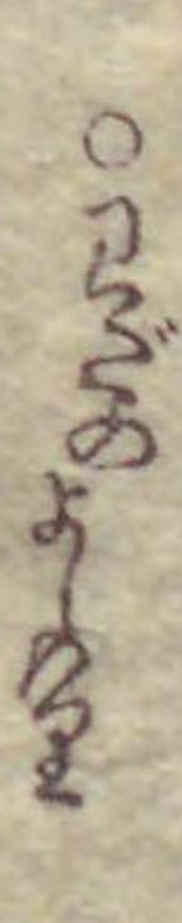わだのよしもり
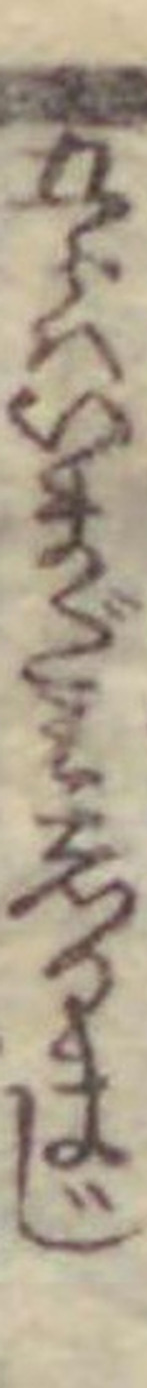五郎はいまだみしるまじ
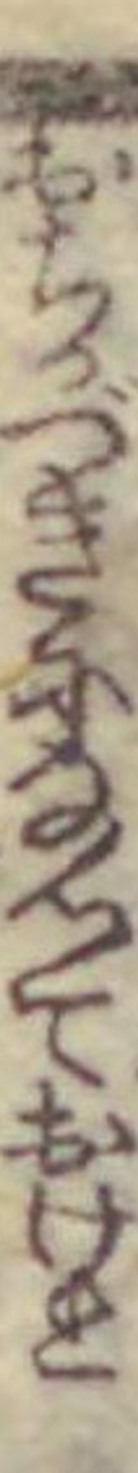いちかづきになつておけと
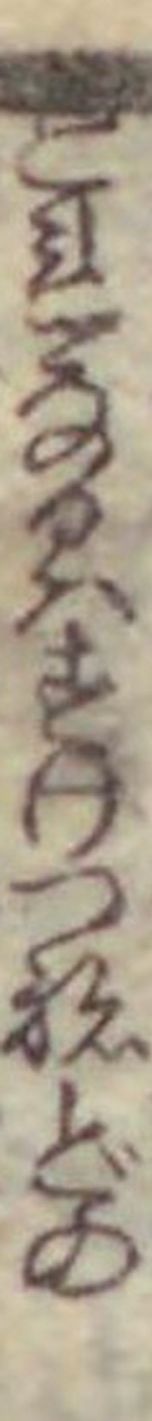これなるはすけつねどの
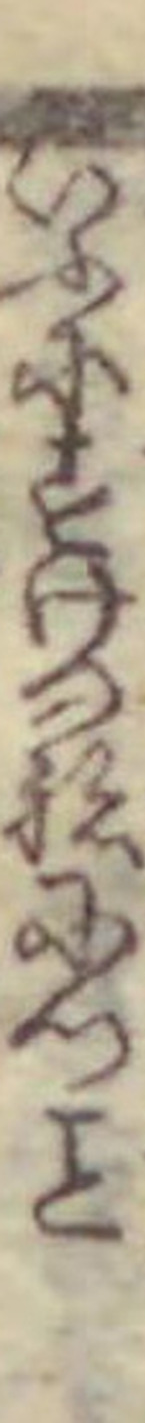おふにすけつねにつこと
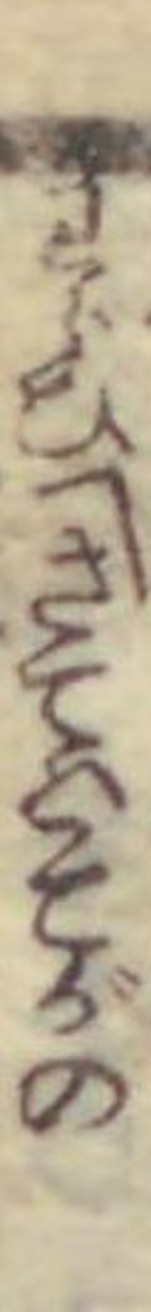わらひ〽さてはそがの
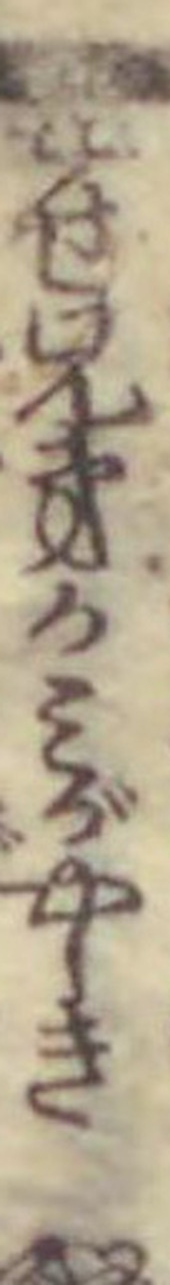やせ兄弟かみがやしき
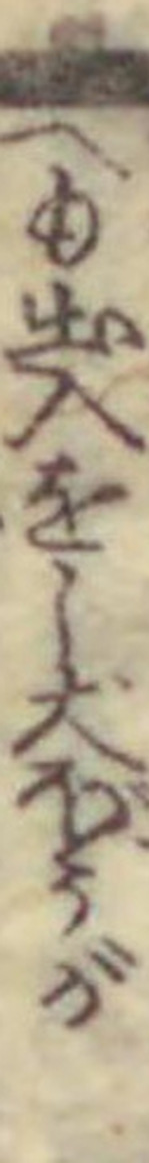へも出入りをし犬ぼうが
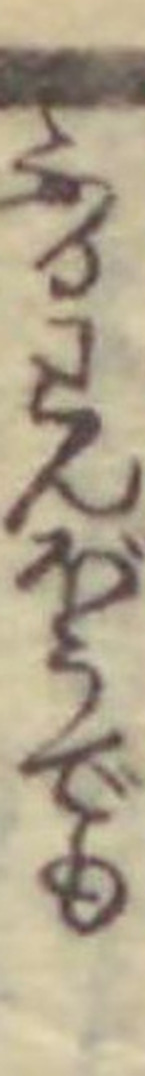ふるわんぼうでも
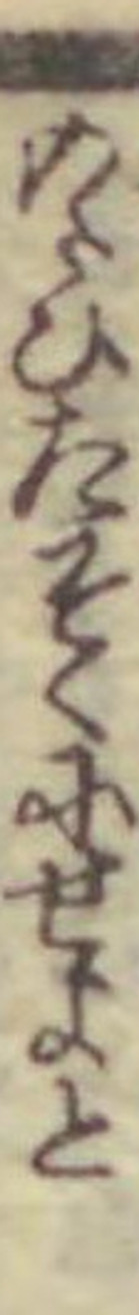もらひたそくにせよと
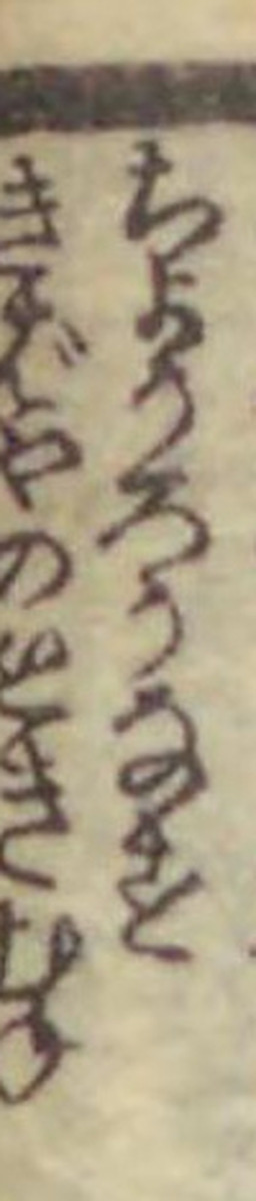きばやのときむね
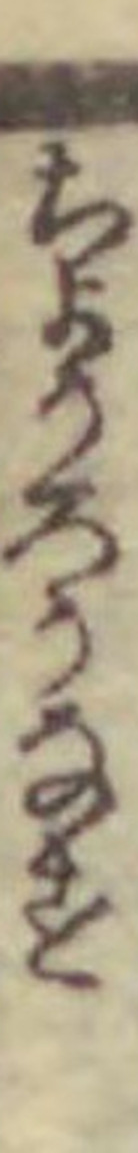ちようろうなす
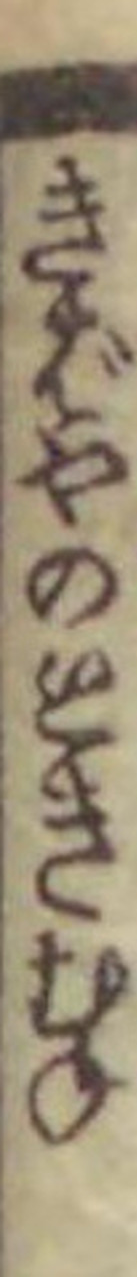きばやのときむね
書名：大時代唐土化物 3巻. 曽我太夫染
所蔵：国立国会図書館 National Diet Library, JAPAN
